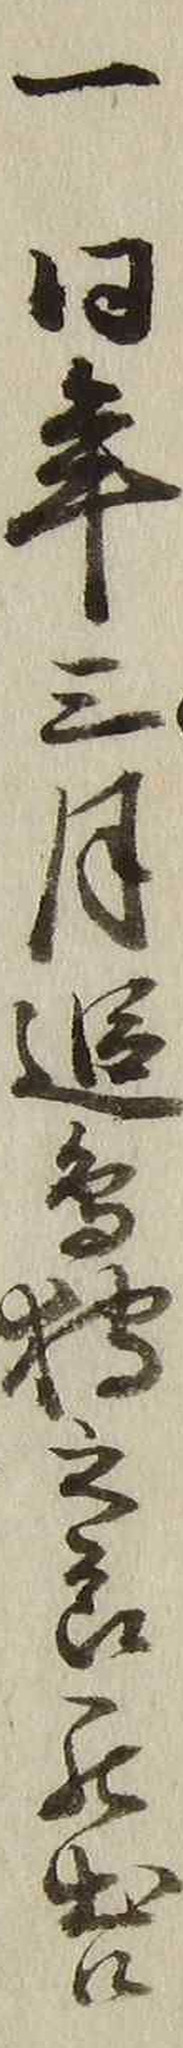一同年三月追鳥狩之節罷出候
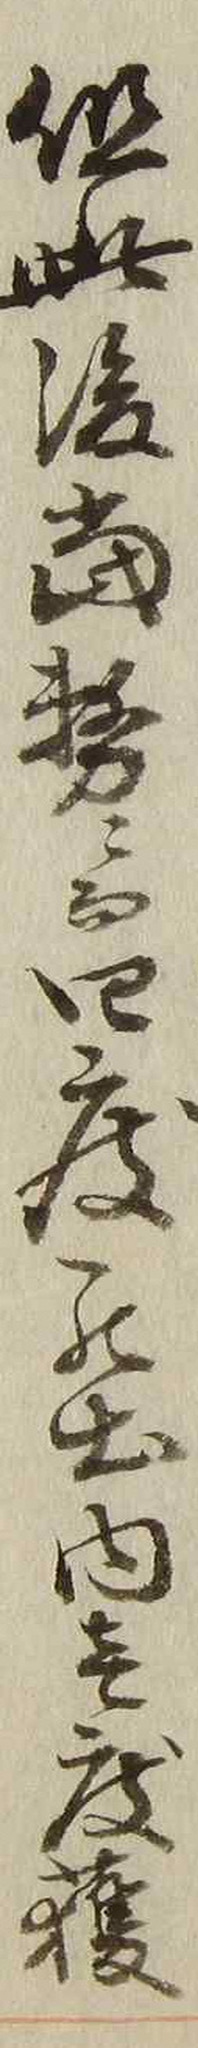但此後当務ニ而四度罷出内壱度獲
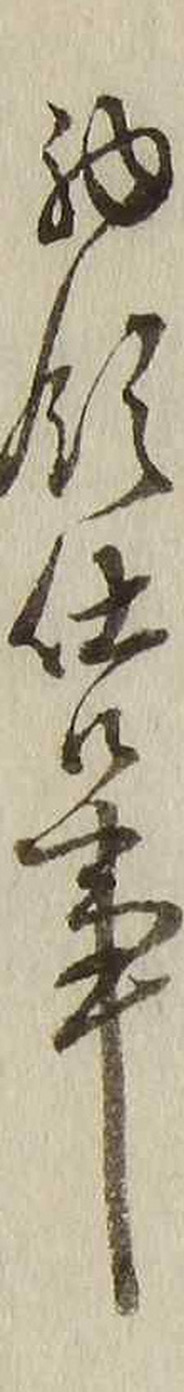拝領仕候事
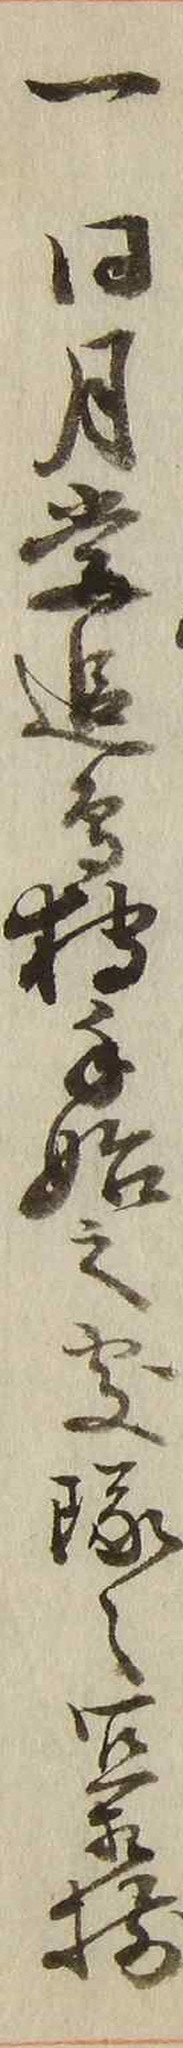一同月当追鳥狩手始之処隊々宜相揃

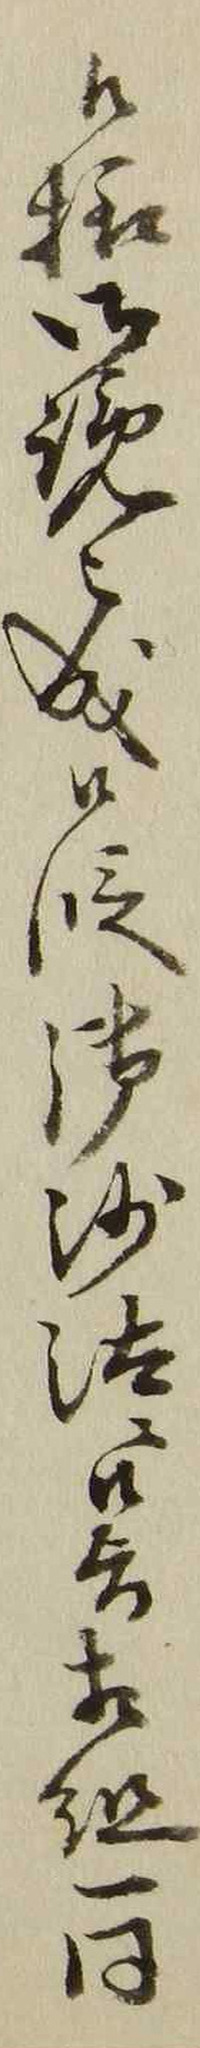被候様御覧被成候段御沙汰ニ候旨相組一同
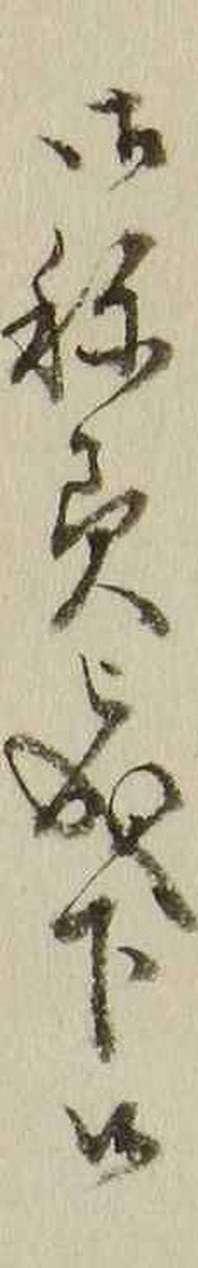御称美被成下候
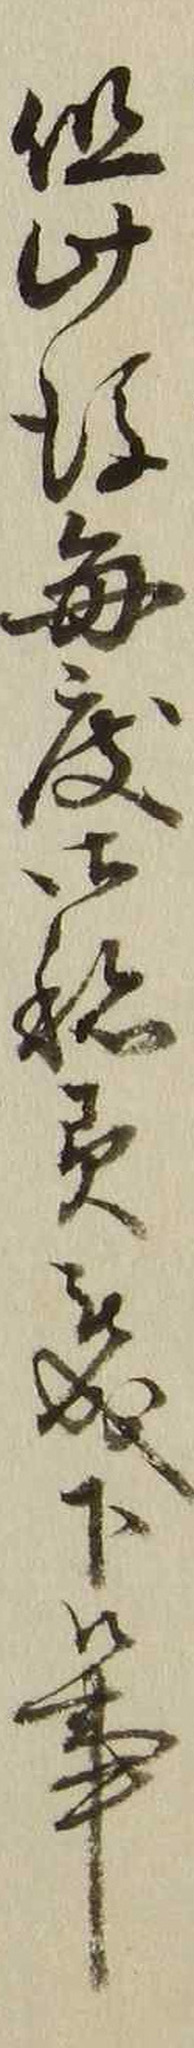但此後毎度御称美被成下候事
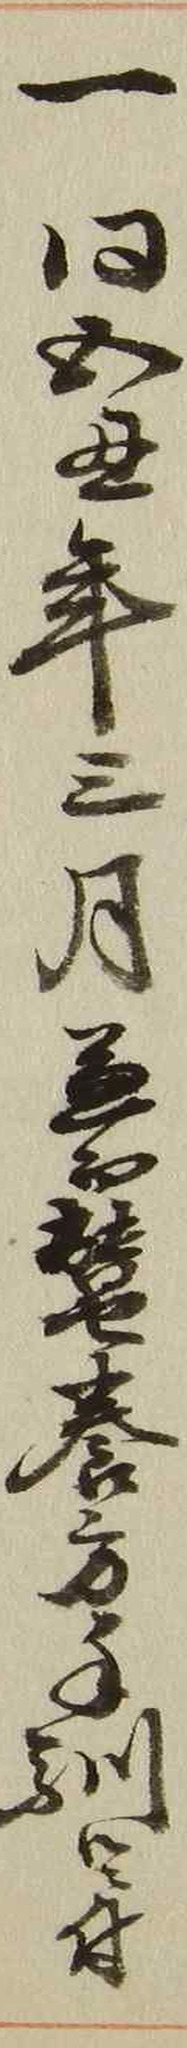一同五丑年三月兼而蚕養方手馴候ニ付
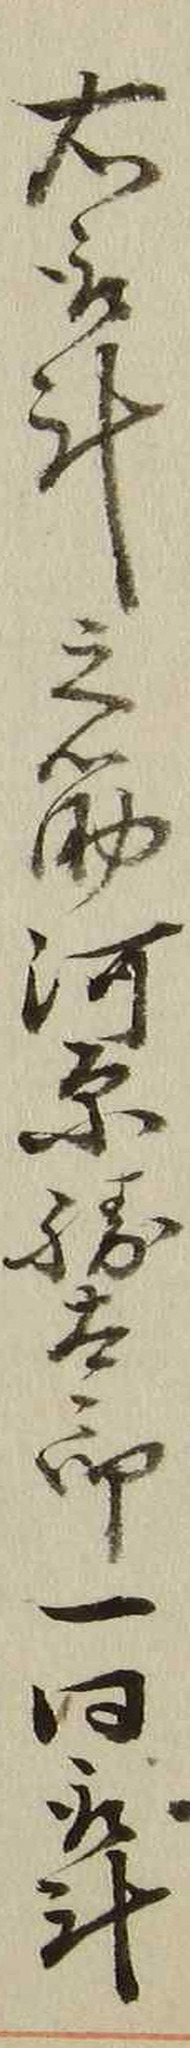右取計之筋河原勝太郎一同取計
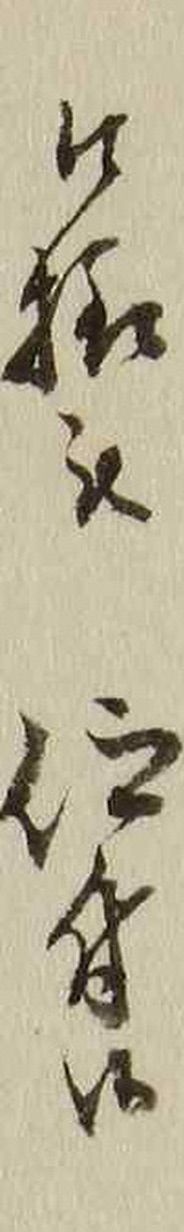候様被仰付候
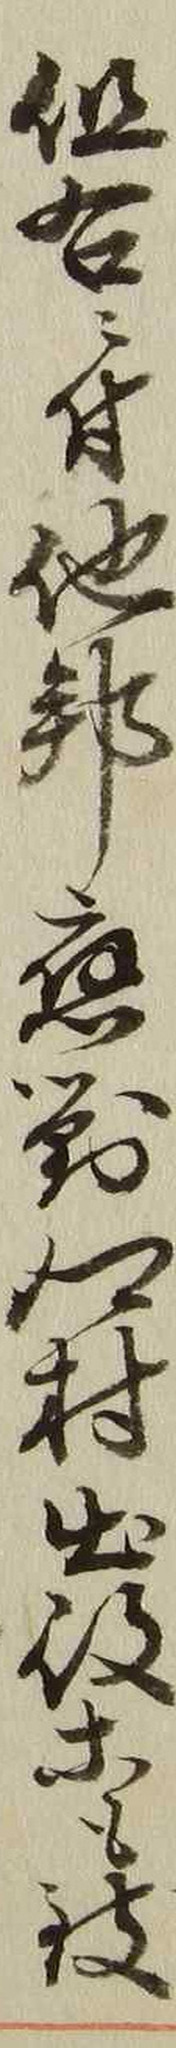但右ニ付他邦応対郷村出役等も致
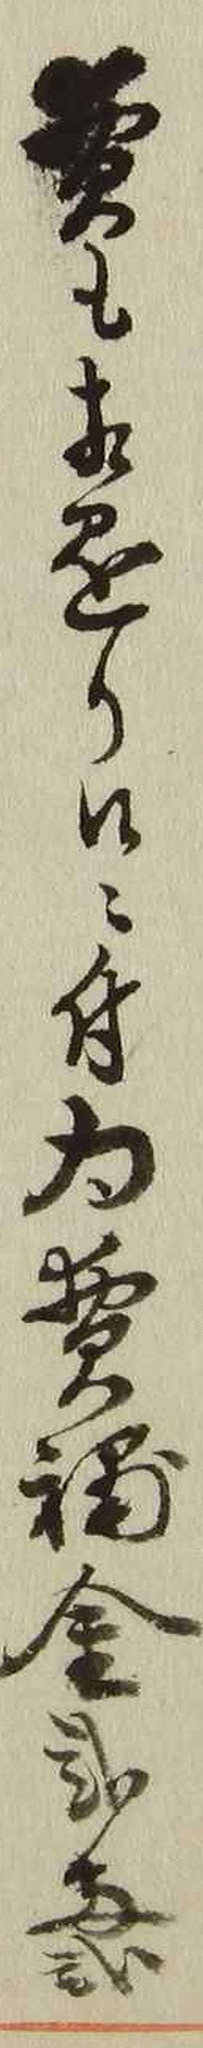費も相懸り候ニ付為費補金弐両弐
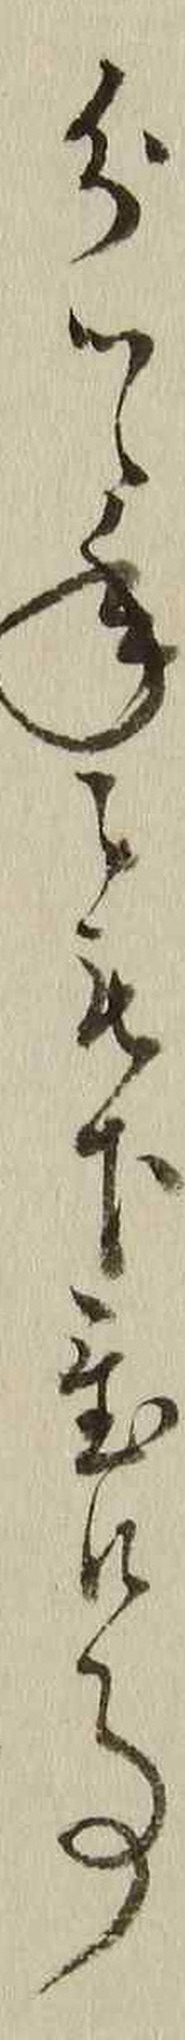分ツヽ年々被下置候事
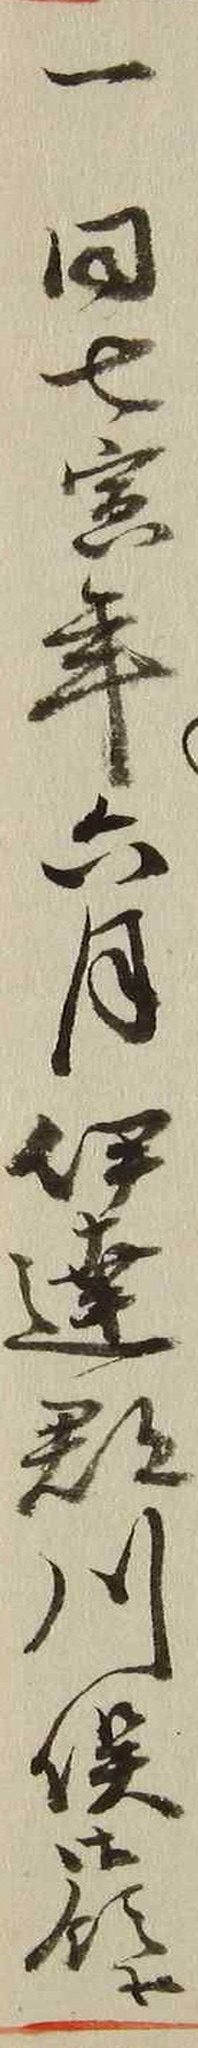一同七寅年六月伊達郡川俣御領江
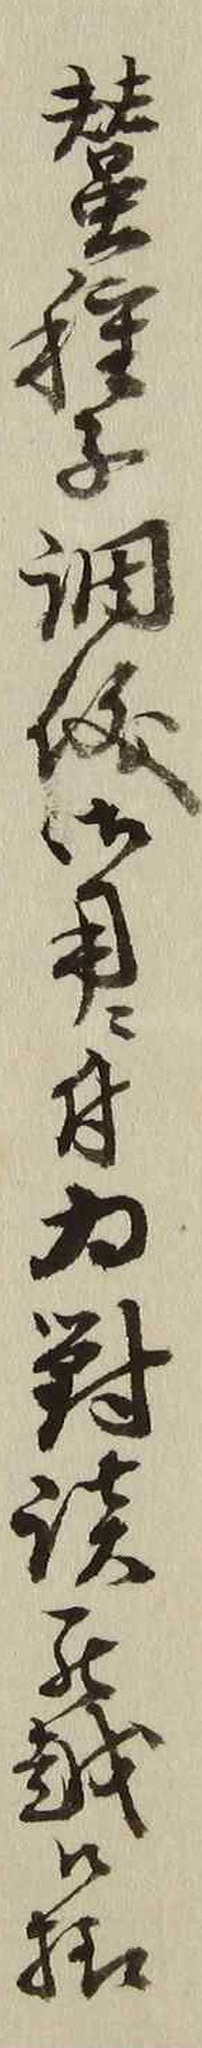蚕種子調儀御用ニ付為対談罷越候様
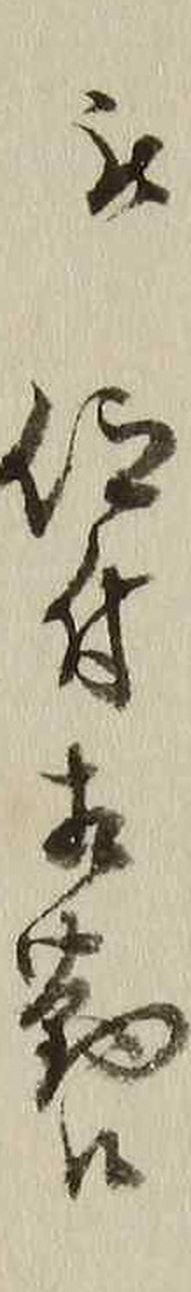被仰付相勤候
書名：諸士系譜　巻之31　い之部31
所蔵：会津若松市立会津図書館
